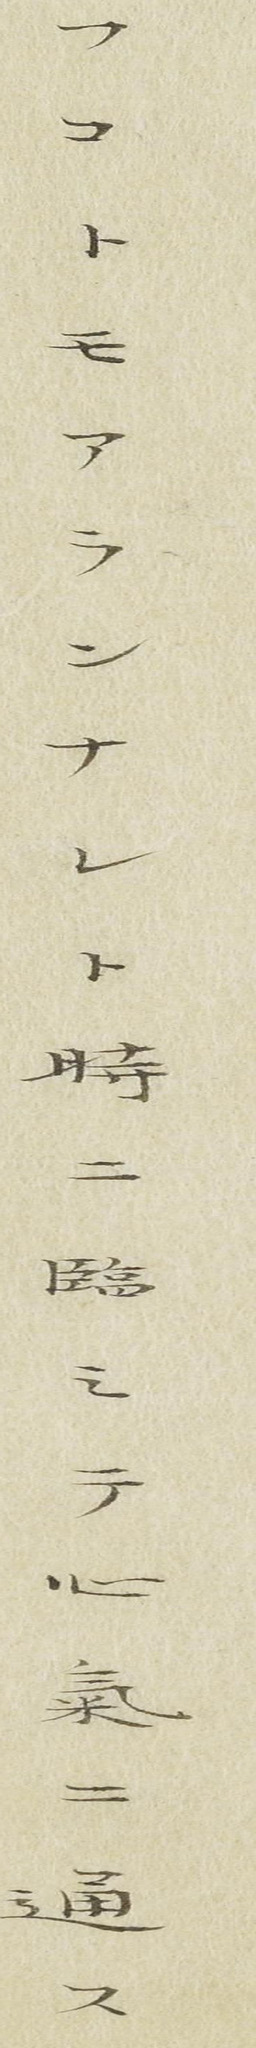フコトモアランナレト時ニ臨ミテ心気ニ通ス
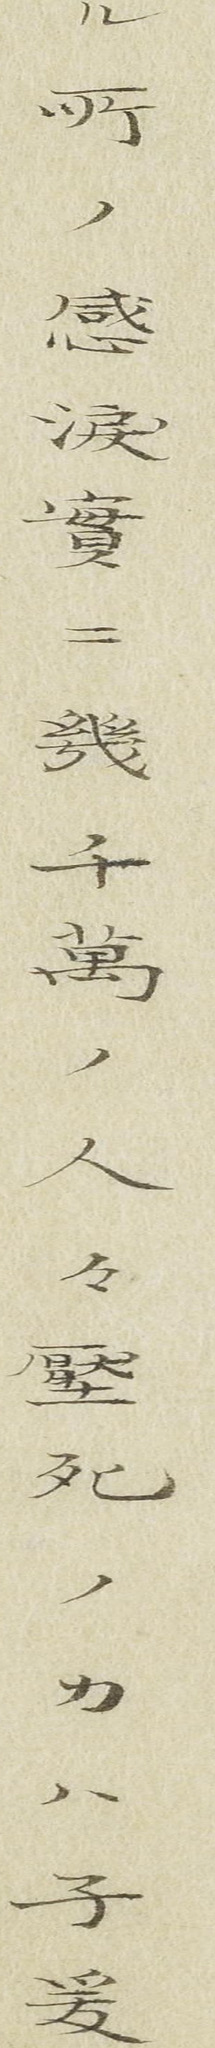ル所ノ感涙実ニ幾千万ノ人々圧死ノカハ子爰
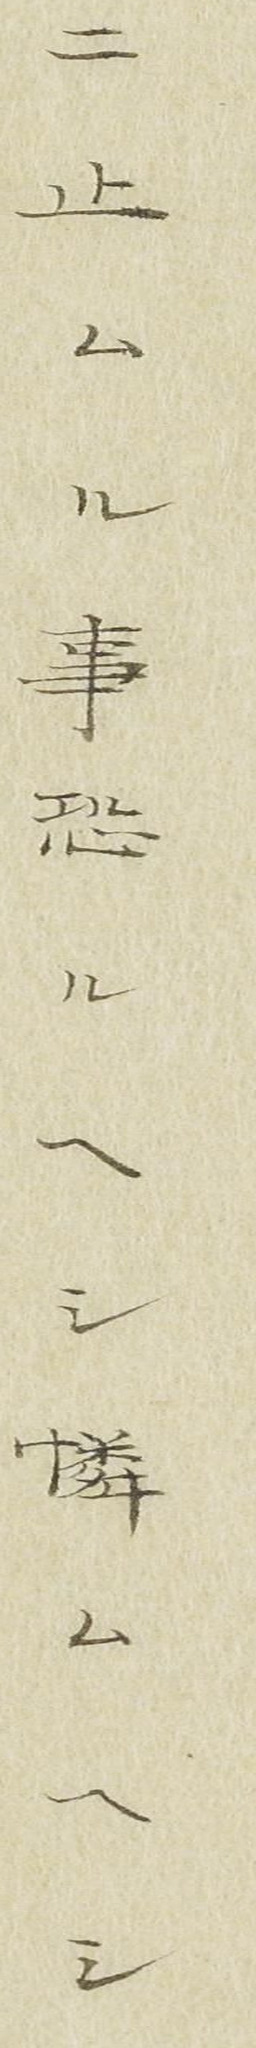ニ止ムル事恐ルヘシ憐ムヘシ

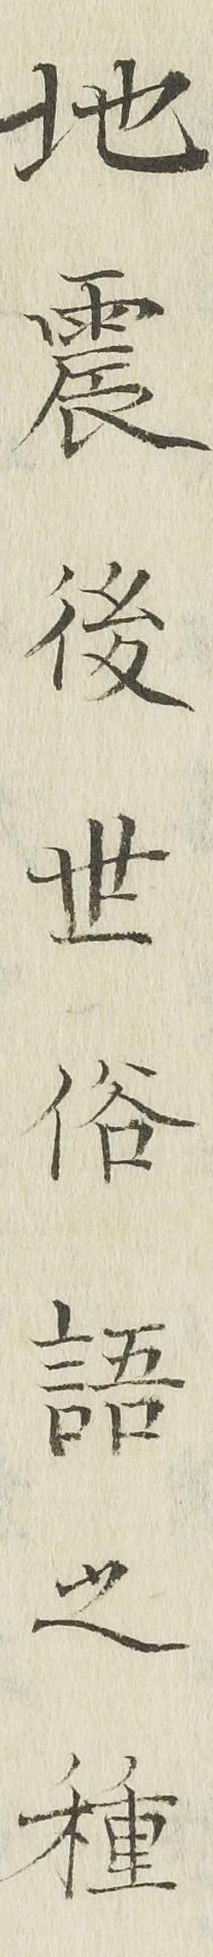地震後世俗語之種

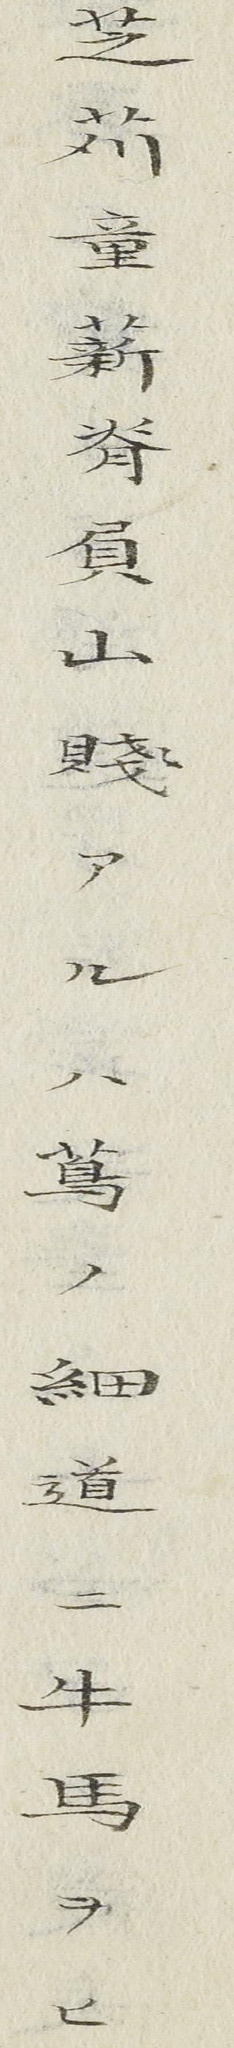芝苅童薪妹負山賤アルハ蔦ノ細道ニ牛馬ヲヒ
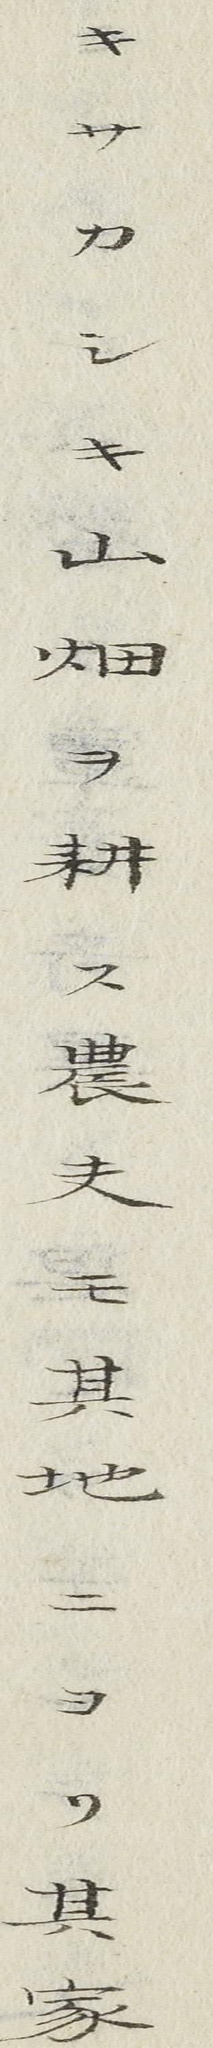キサカシキ山畑ヲ耕ス農夫モ其地ニヨリ其家
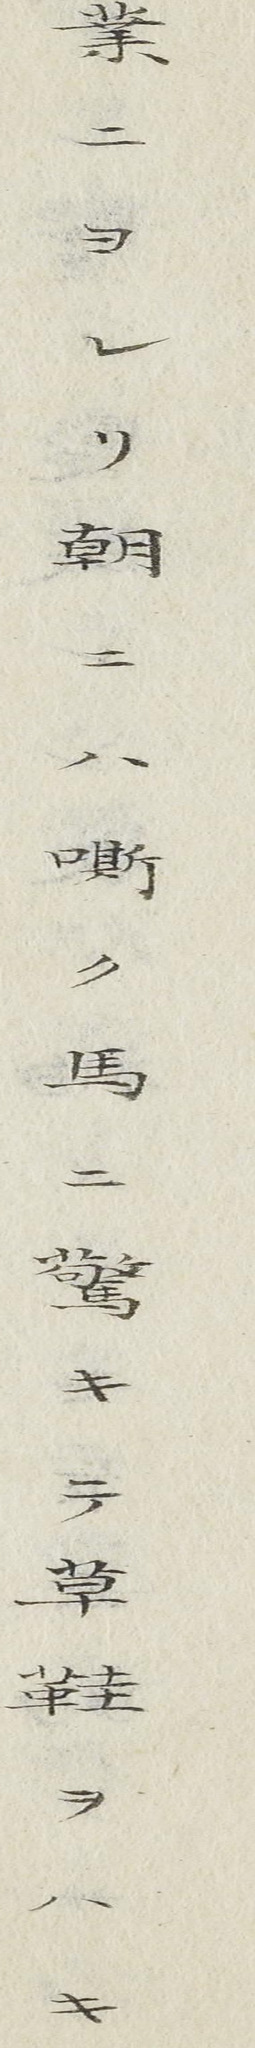業ニヨレリ朝ニハ嘶ク馬ニ驚キテ草履ヲハキ
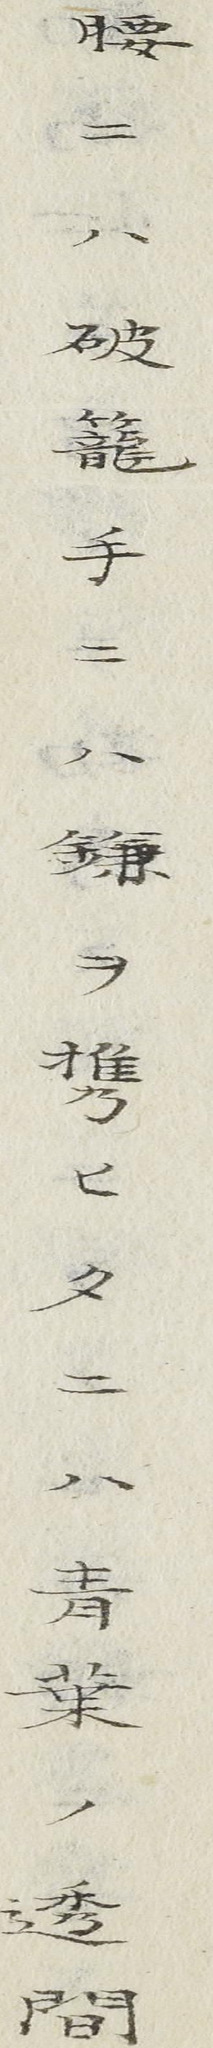腰ニハ破籠手ニハ鎌ヲ携ヒタニハ青葉ノ透間
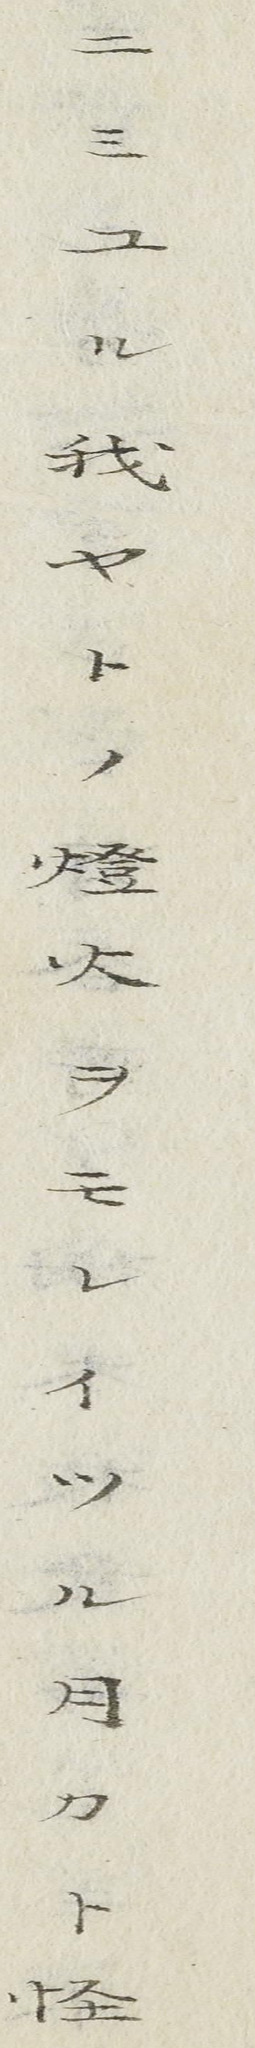ニミユル我ヤトノ燈火エヲモレイツル月カト怪
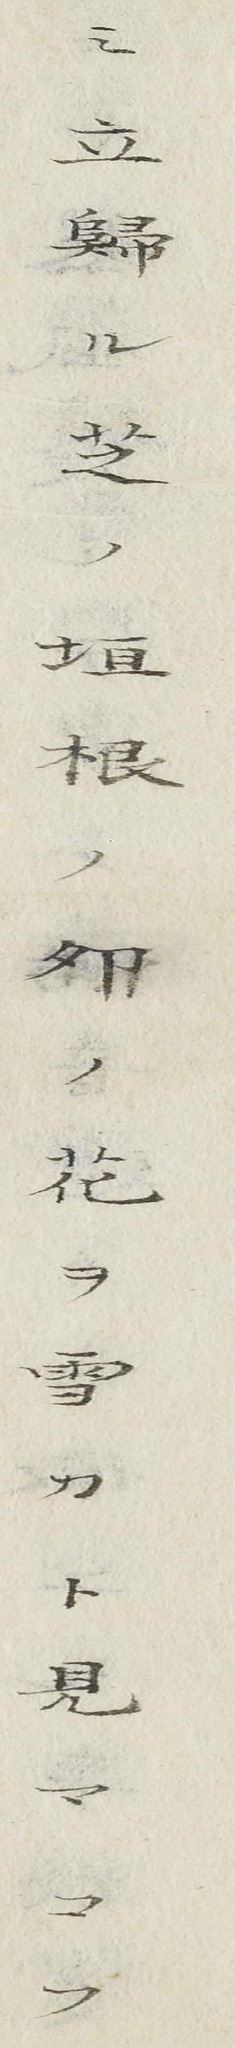ミ立帰ル芝ノ垣根ノ卯ノ花ヲ雪カト見マコフ
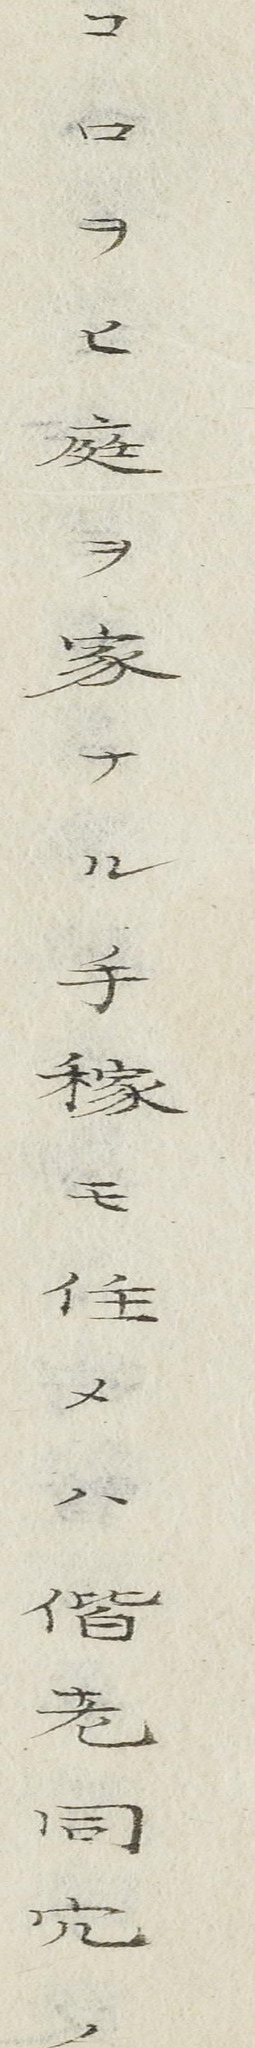コロヲヒ庭ヲ家ナル手稼モ住メハ偕老同穴ノ
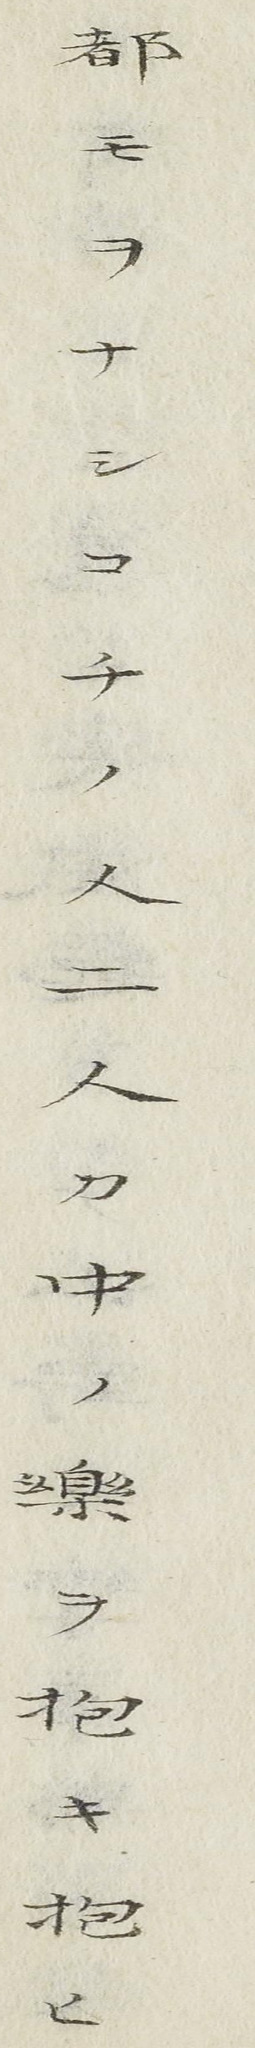都モヲナシコチノ人二人カ中ノ楽ヲ抱キ抱ヒ
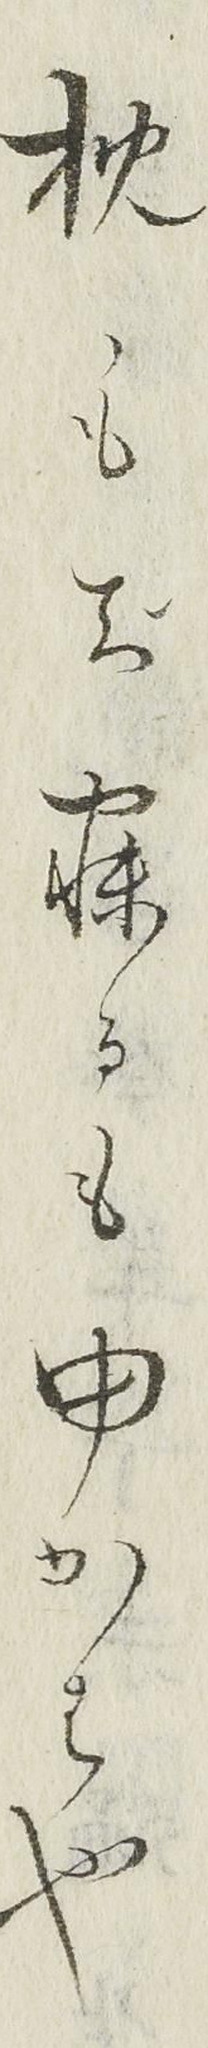テ枕もち寐るも由かはや
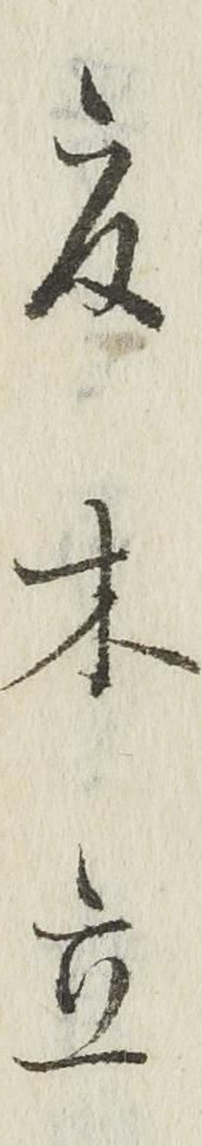夏木立

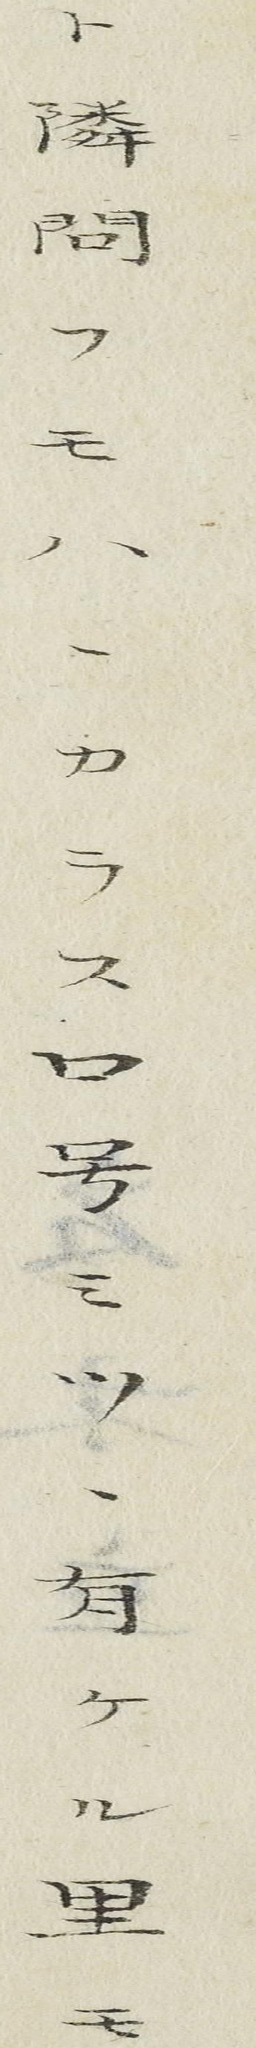ト隣問フモハヽカラス口号ミツヽ有ケル里モ
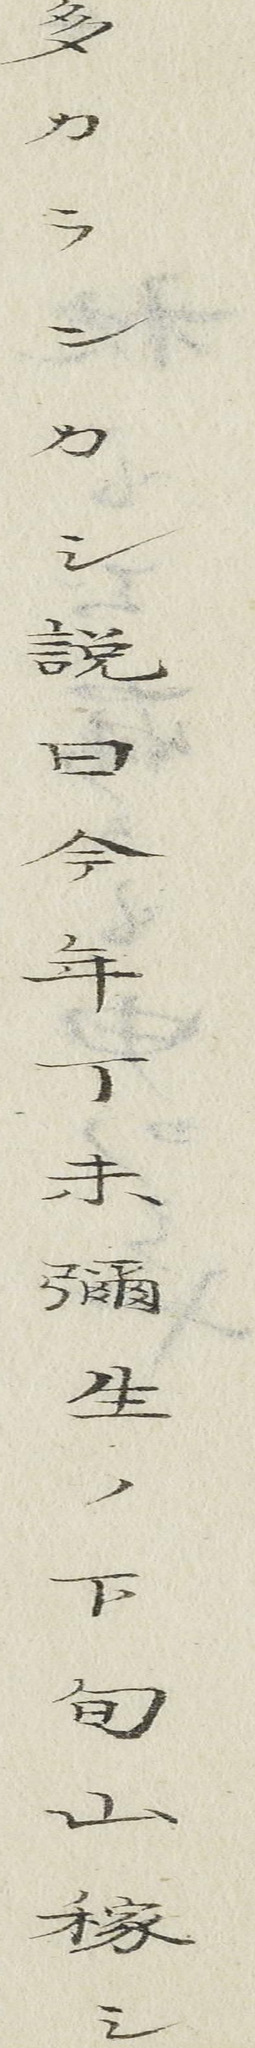多カランカシ説曰今年丁未弥生ノ下旬山稼シ
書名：地災撮要　地震之部　巻ノ二
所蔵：東京大学地震研究所図書室 Earthquake Research Institute Library, The University of Tokyo, JAPAN
